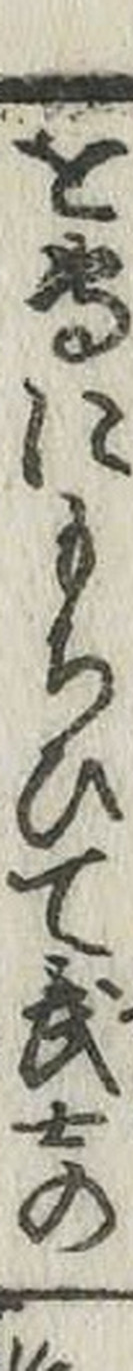を専にもちひて武士の
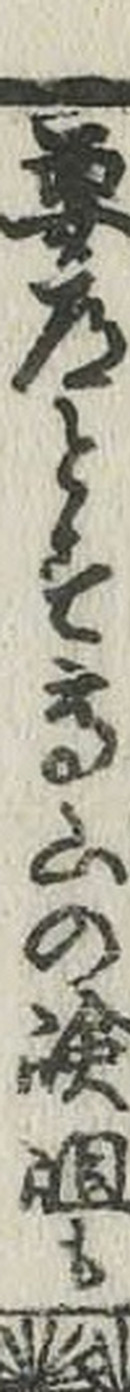要道とす高山の険阻も
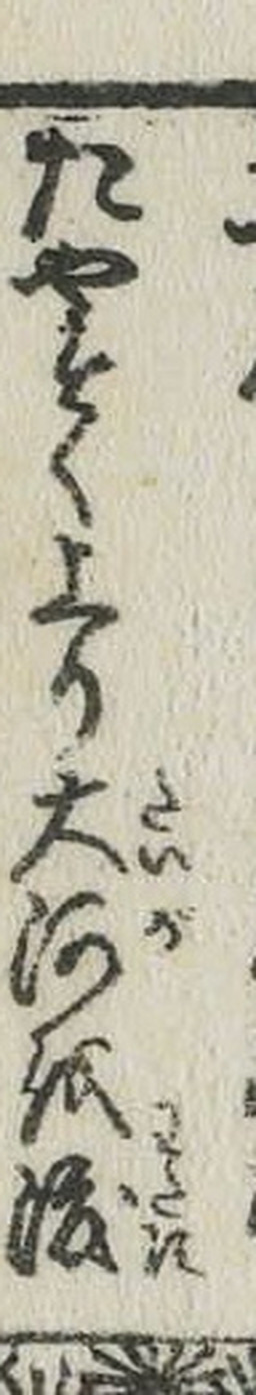たやすく上り大河を渡
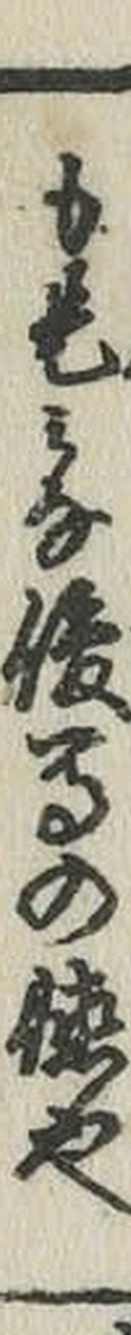も是みな駿馬の徳也

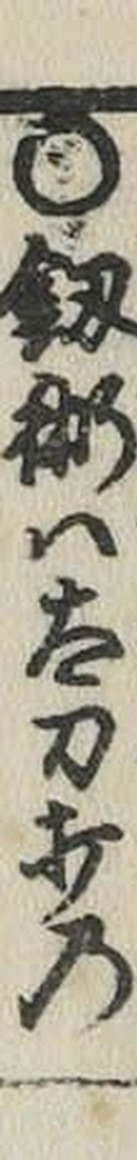○剣術は太刀打の
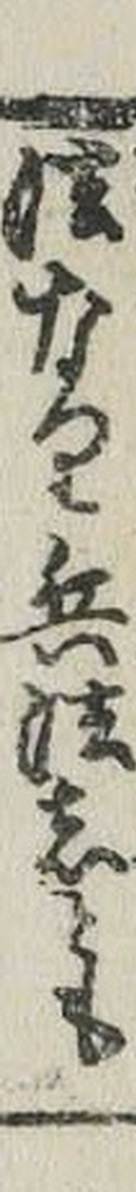法なり兵法者とも
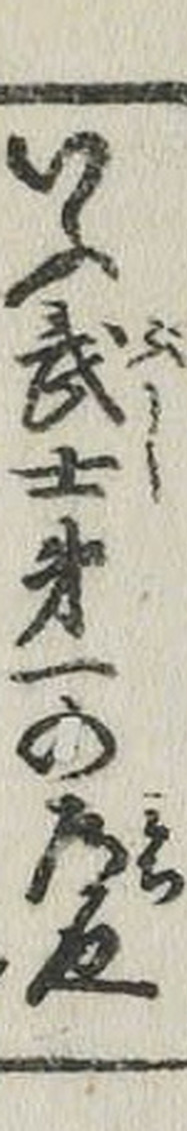いふ武士第一の道也
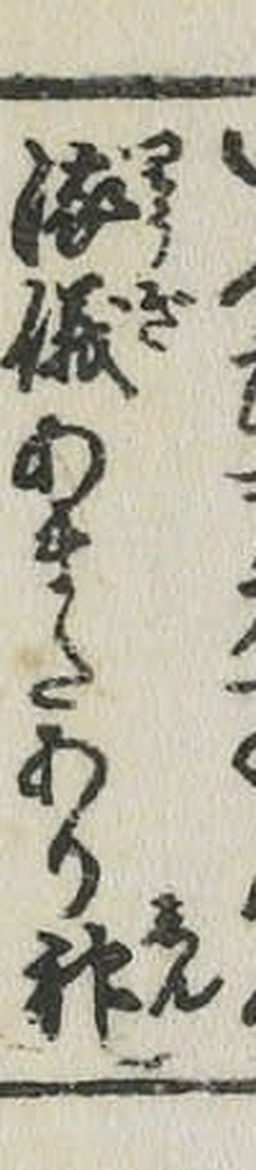流儀あまたあり神
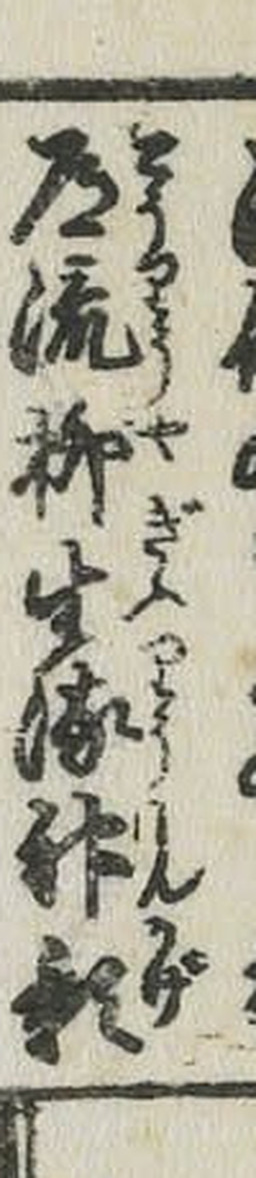道流柳生流神影
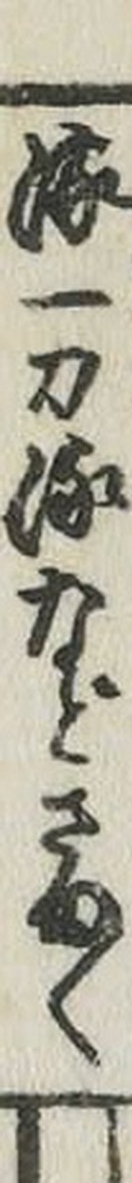流一刀流などさま〳〵
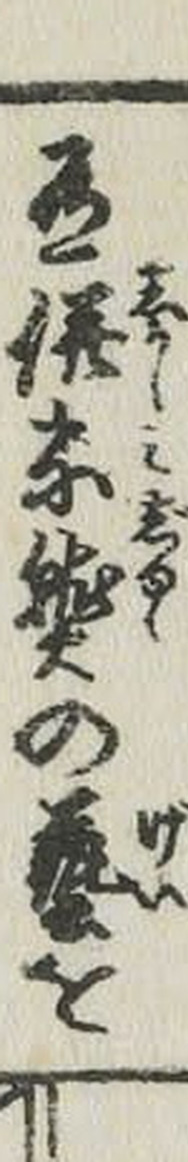有併未熟の芸を
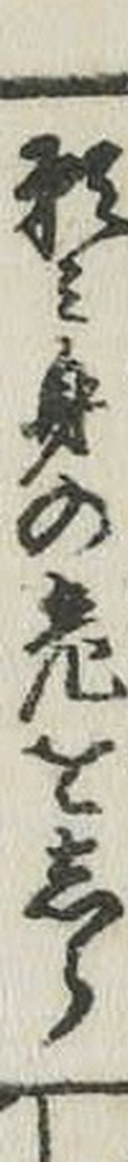頼み身の危をしら
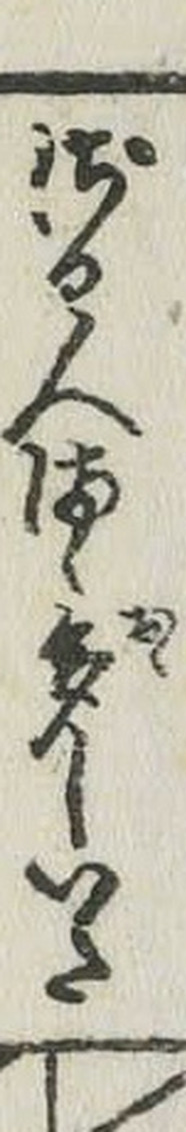ざる人まゝ多しいた
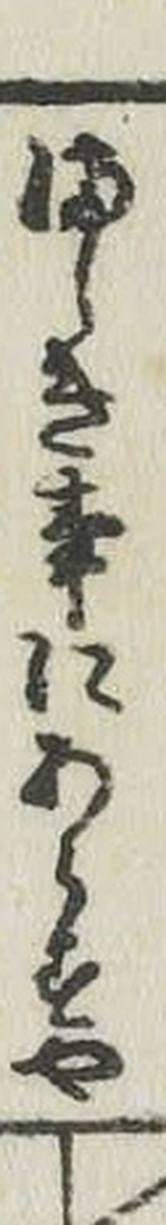ましき事にあらすや
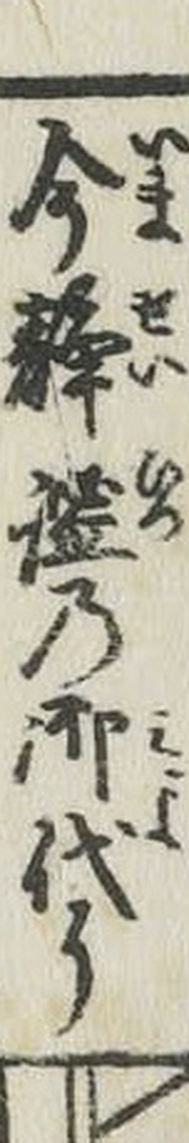今静謐の御代に
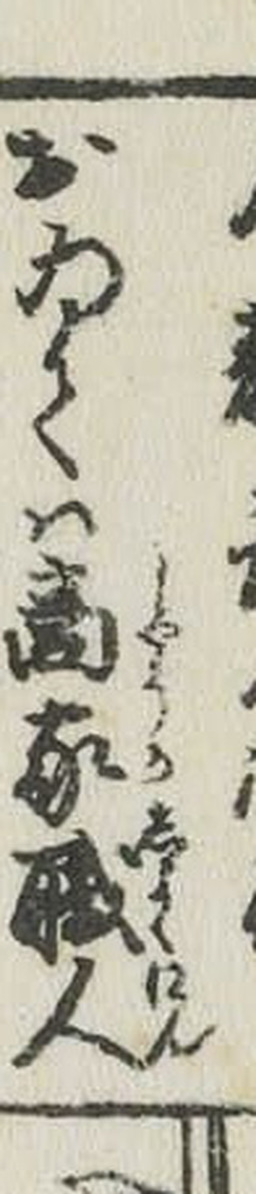おゐては商家職人
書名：増補頭書訓蒙図彙大成 10巻 10:巻之21
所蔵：東京学芸大学教育コンテンツアーカイブ
